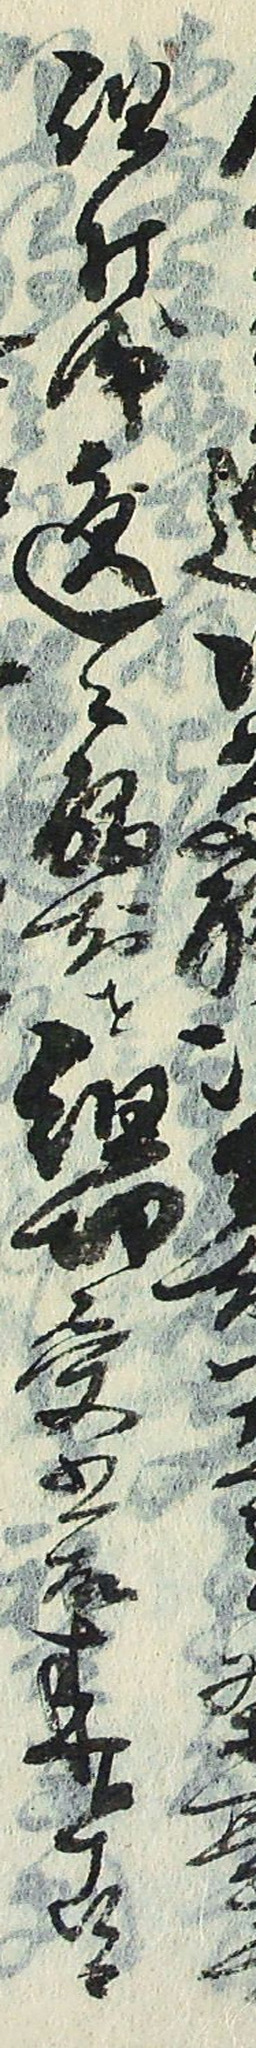組村浦逸々触知せ組切受書取来る十四日
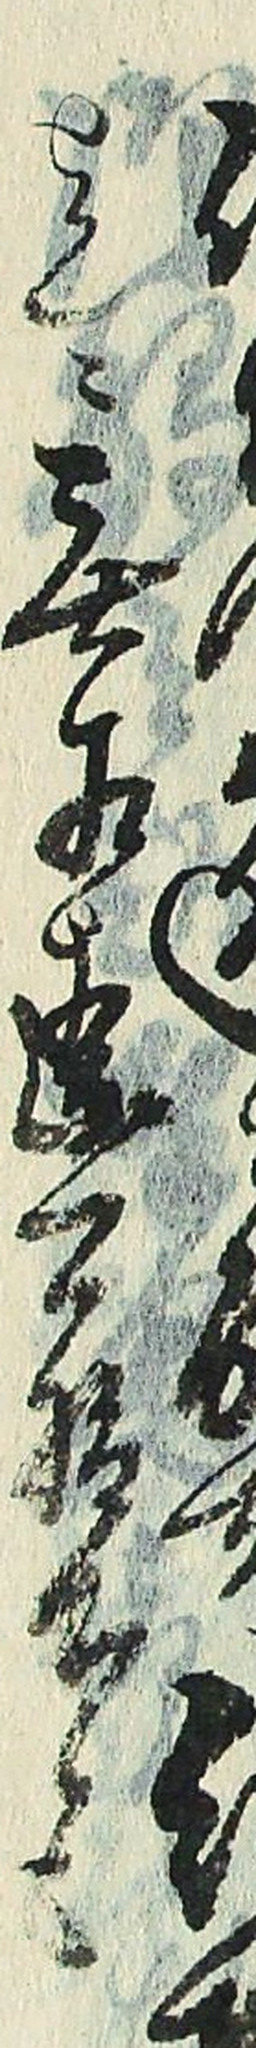迄に無相違可指出候以上

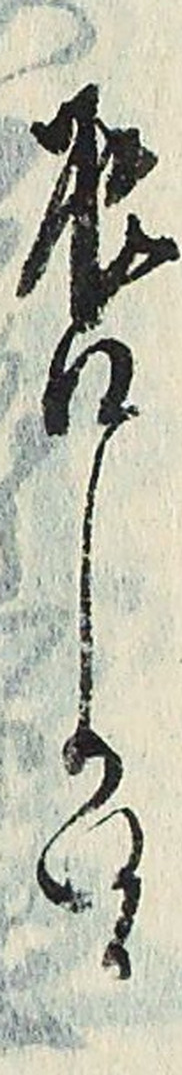辰四月四日
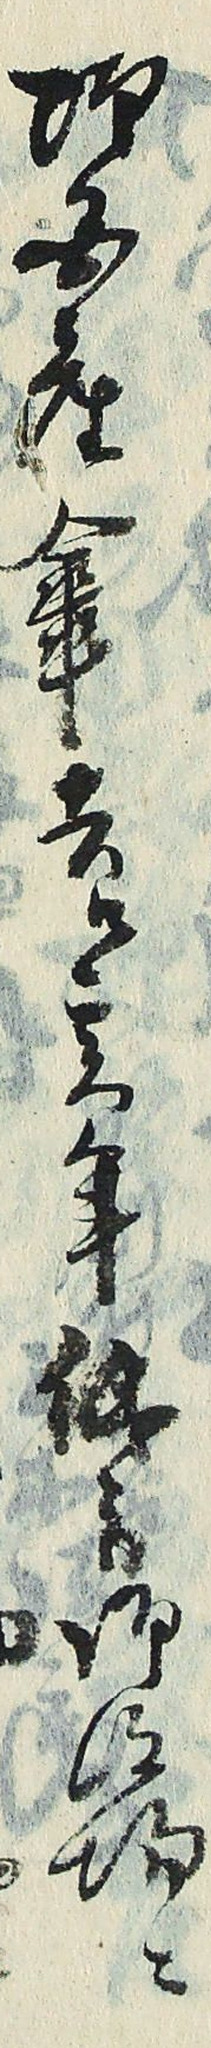御国産傘去る亥年紙方御役場に
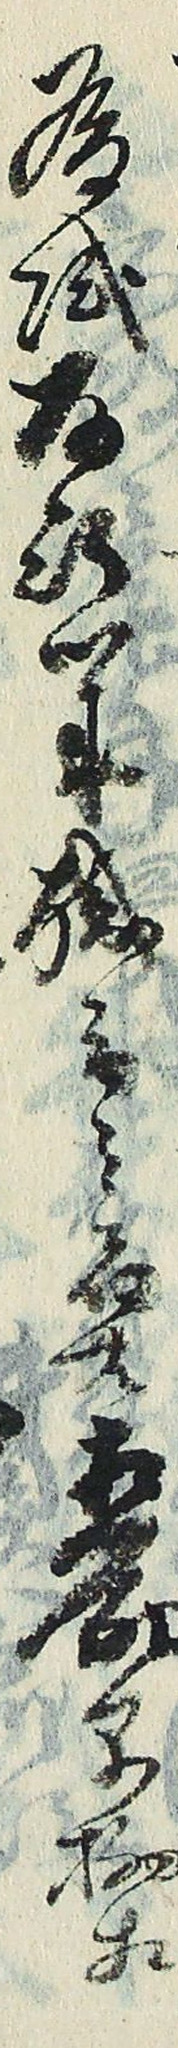為試取都以来職方之者共相励早柄相
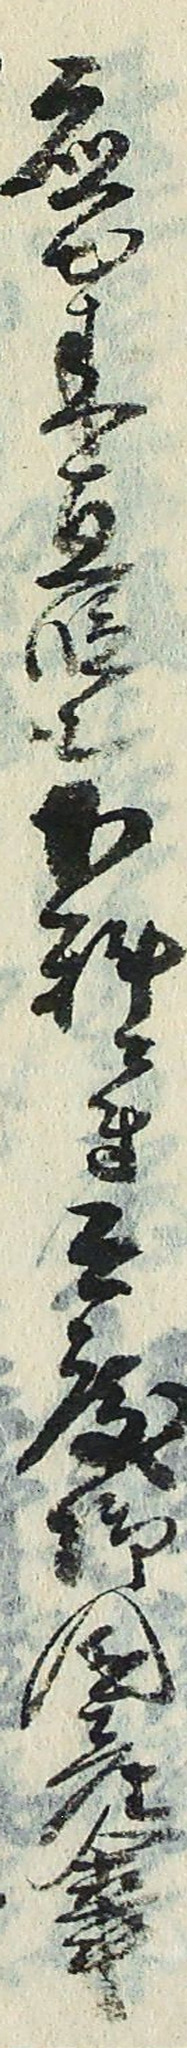応出来直段も下料に付今度御国産傘
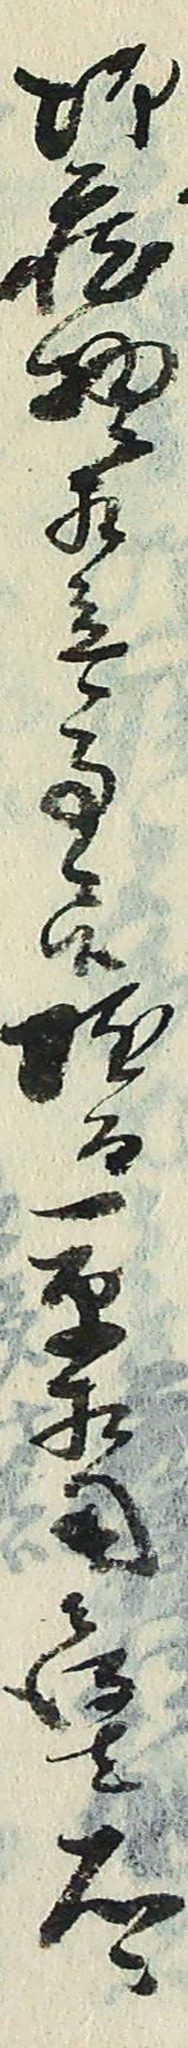御蔵物に相立候事に候随而一筆相用候得者右に
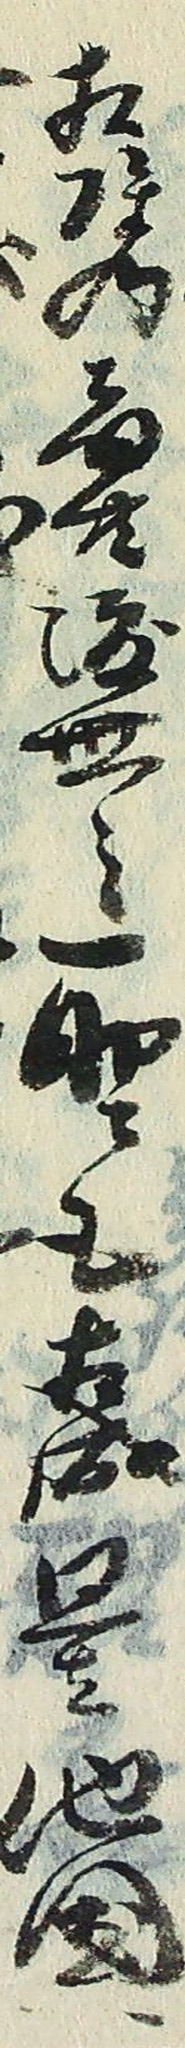相携者共渡世之一助にも相成且は他国へ
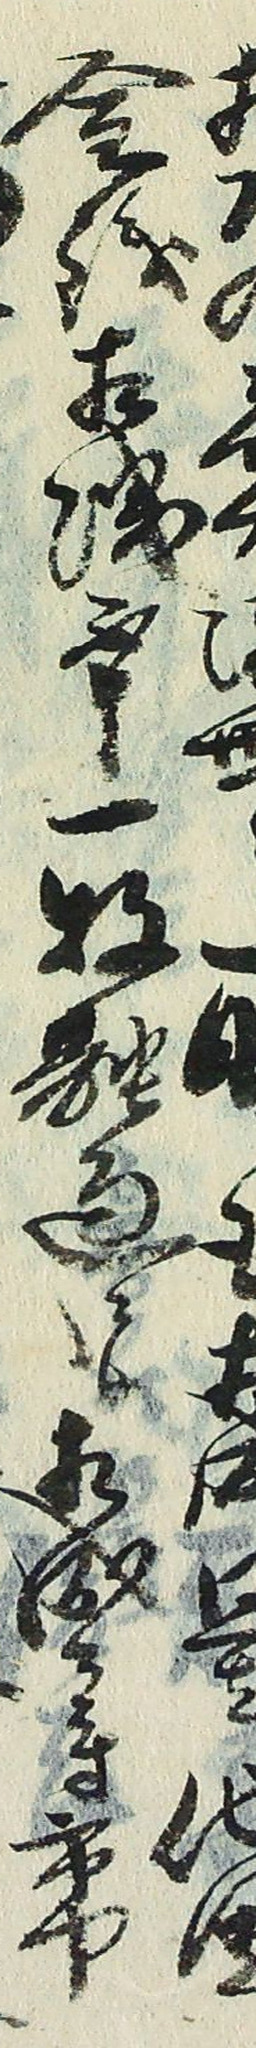金銭相洩不申一牧融通にも相成候に付市中
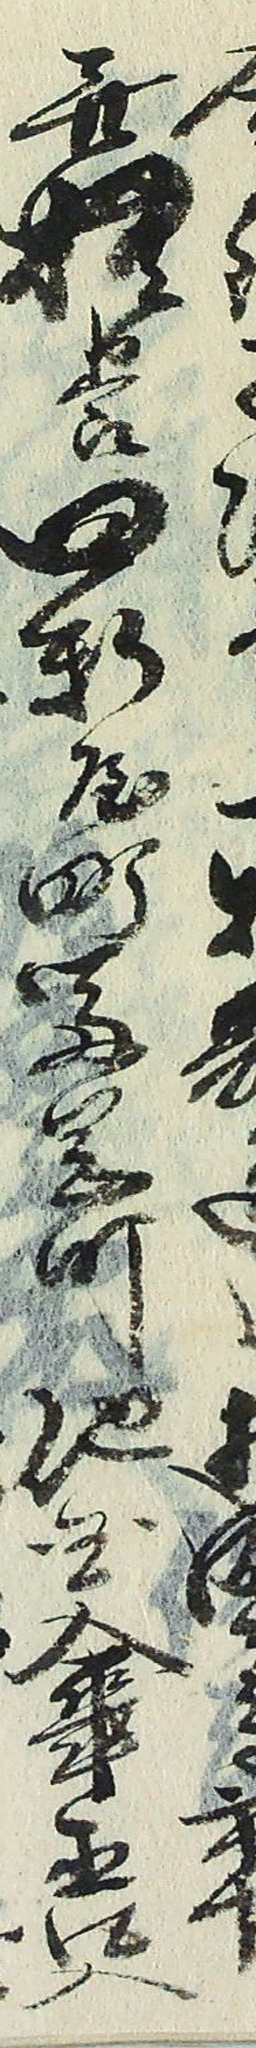幷撫養四軒屋町富岡町他国傘直仕入
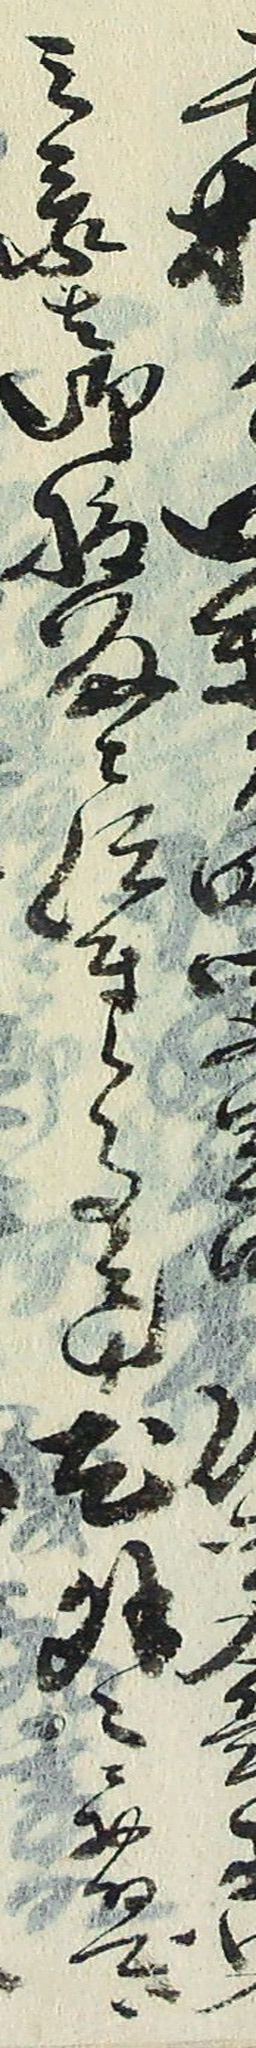之義は御指留被仰付候事に候尤外々におゐては
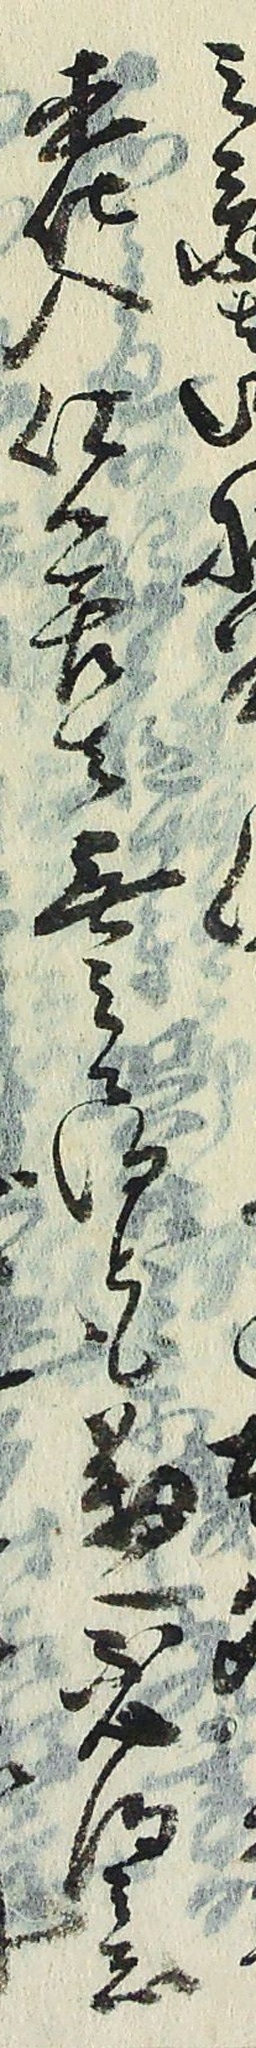直仕入仕候筈は無之候得とも万一不心得之者
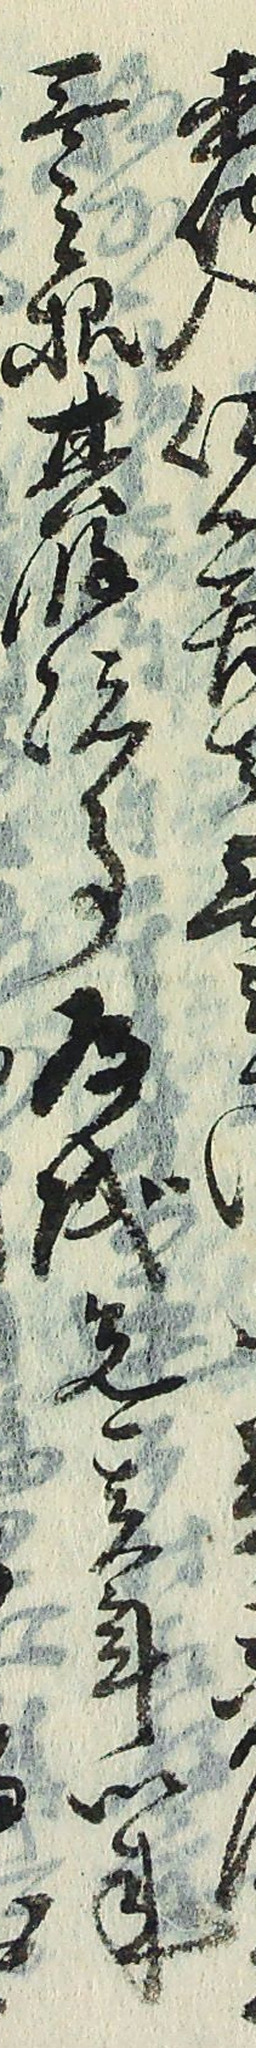無之様其段諸事為試去亥年以来
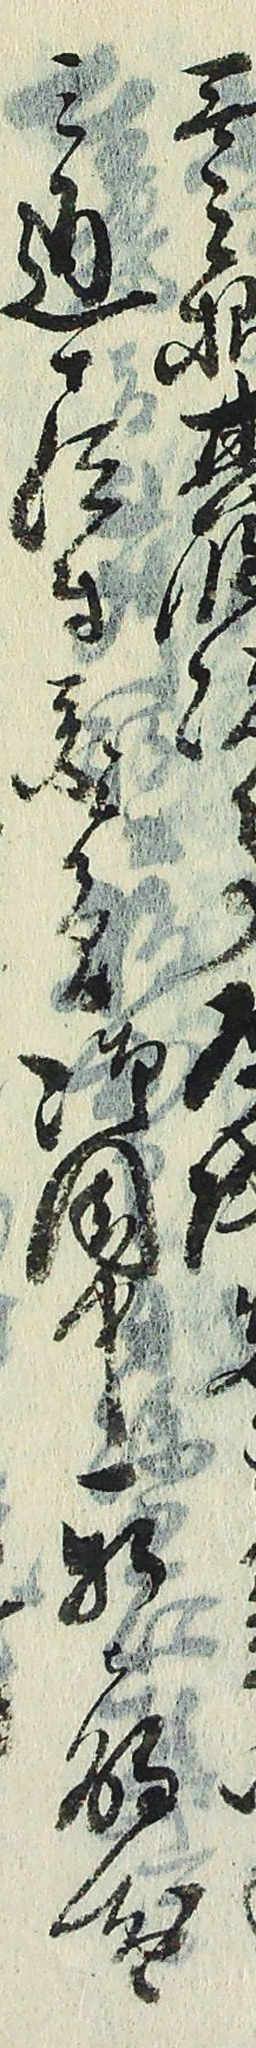之通被仰付義に候間御国中一牧被触知候
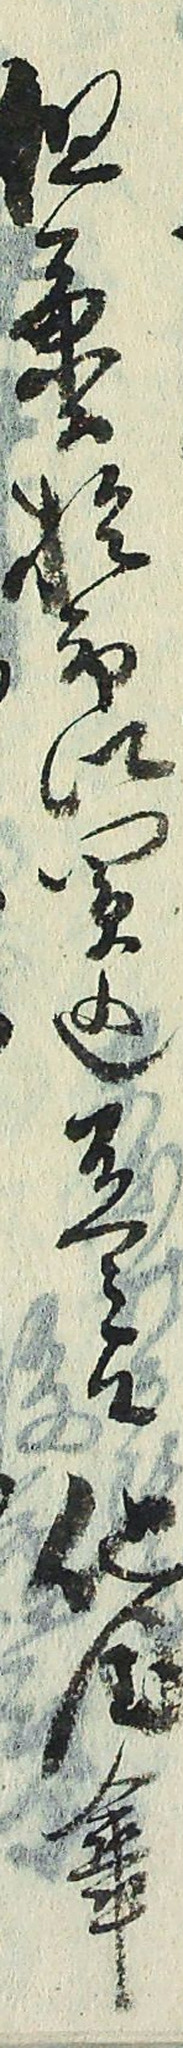但兼而於市郷買込有之候他国傘
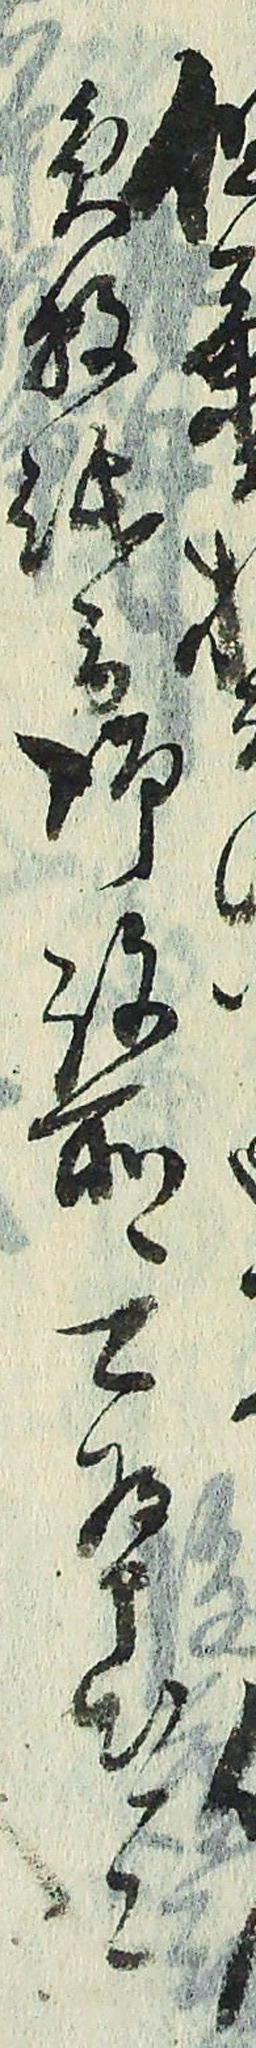員数紙方御役所へ可為申出候以上
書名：諸御用御□受書控
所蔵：鳴門教育大学 Naruto University of Education
